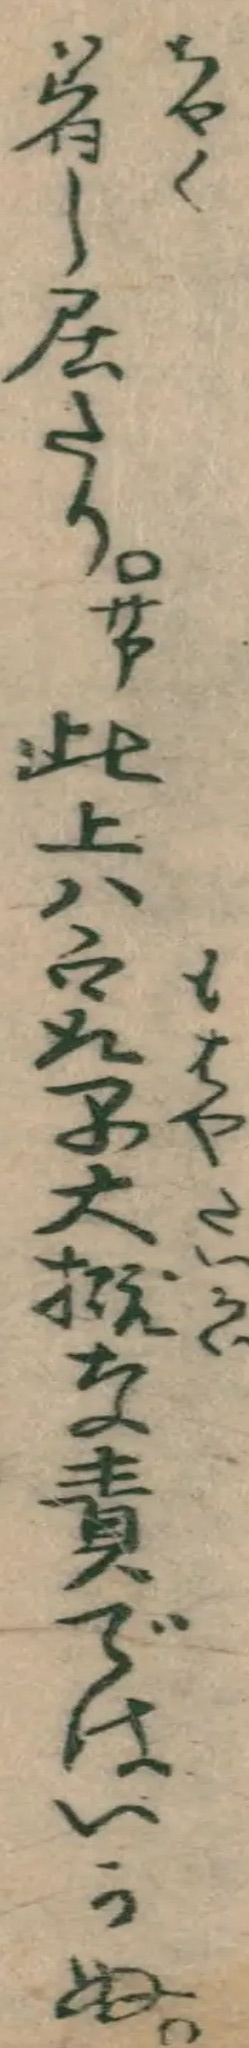着し居たり。サア此上は最早大概な責ではいかぬ。
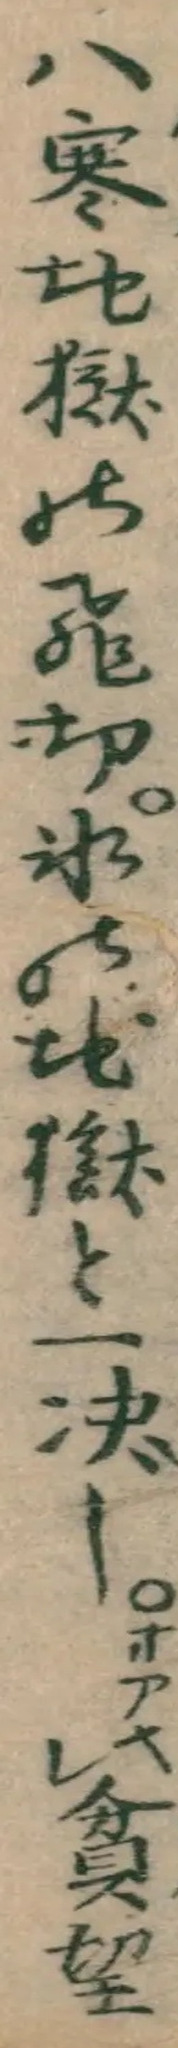八寒地獄の飛切。氷の地獄と一決し。オア此貧望
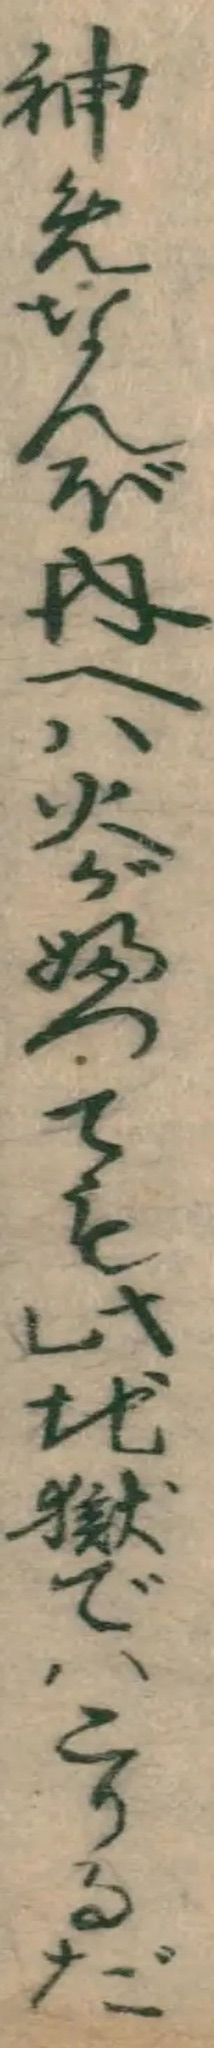神めなんぼ内へは火がふつても此地獄ではこりるだ
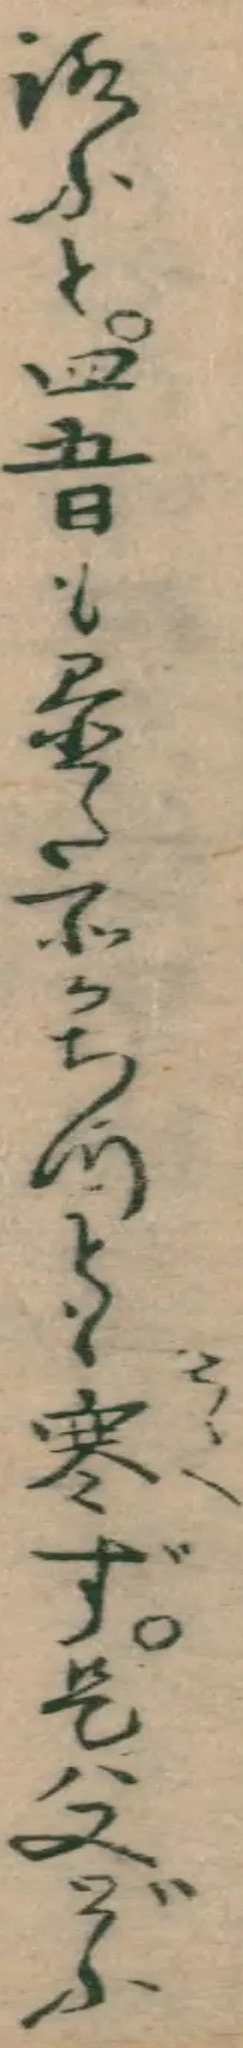ろふと。四五日も置た所かちつとも寒ず。是は又どふ
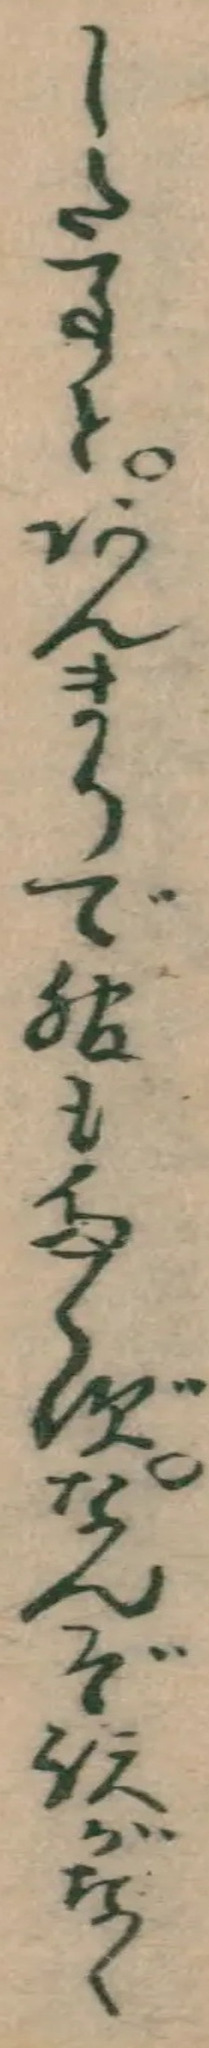した事と。あんまりで腹もたゝず。なんぞ訳がなく
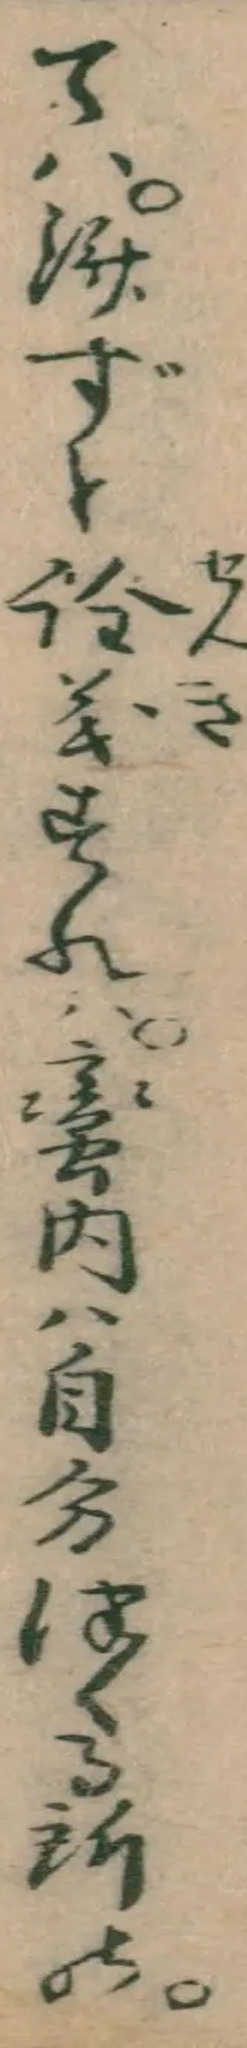ては。済ずと詮義すれは。蛮内は自分つくる所の。
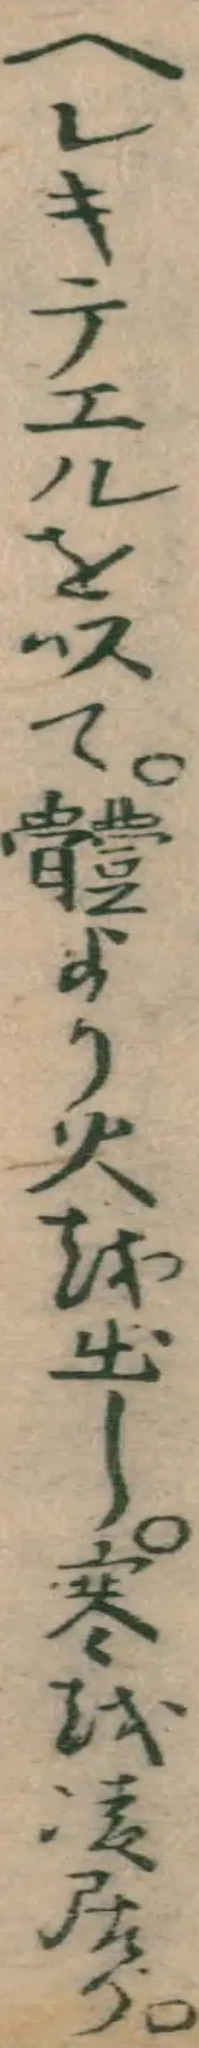ヘレキテエルを以て。体より火を出し。寒を凌居り。
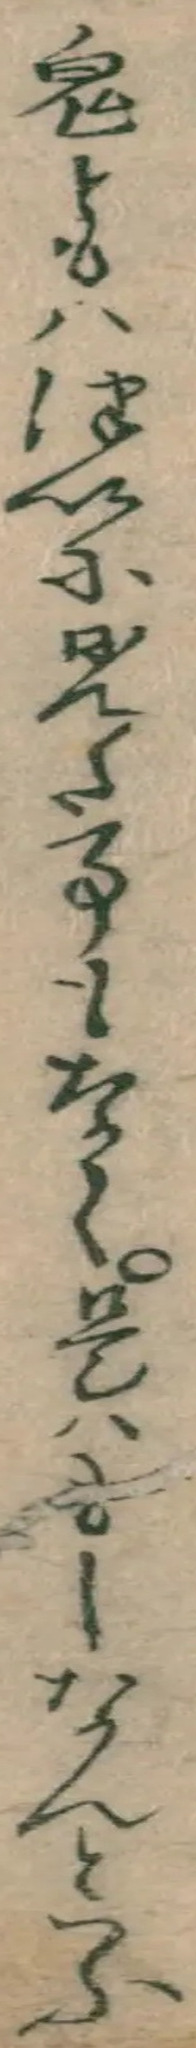鬼ともはついに見たこともなし。是はもしなんといふ
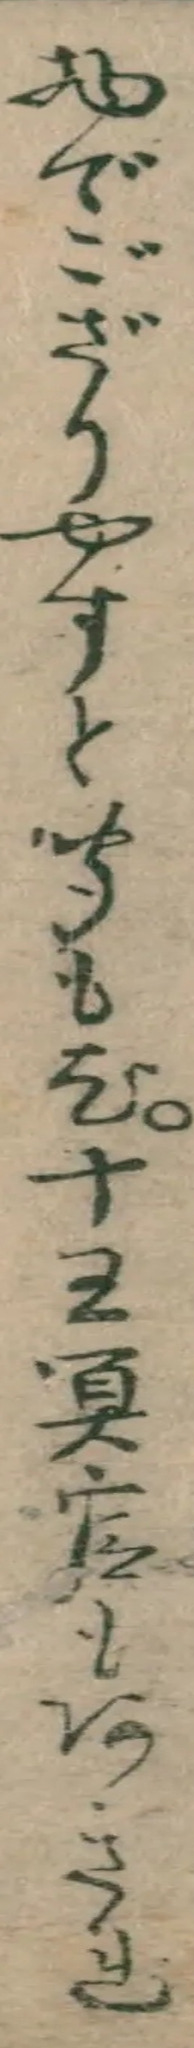物でござりやすと聞も尤。十王冥官もあきれ
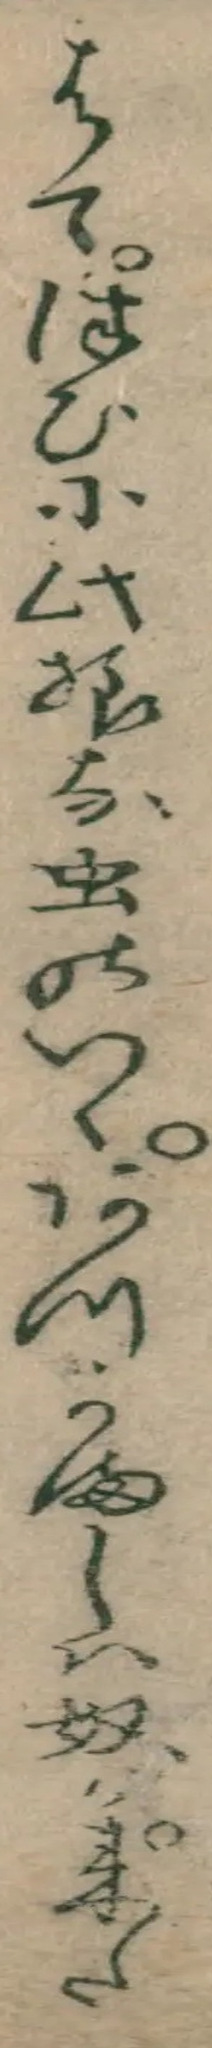はて。つひに此様な虫のいゝ。あつかましい奴か。来た
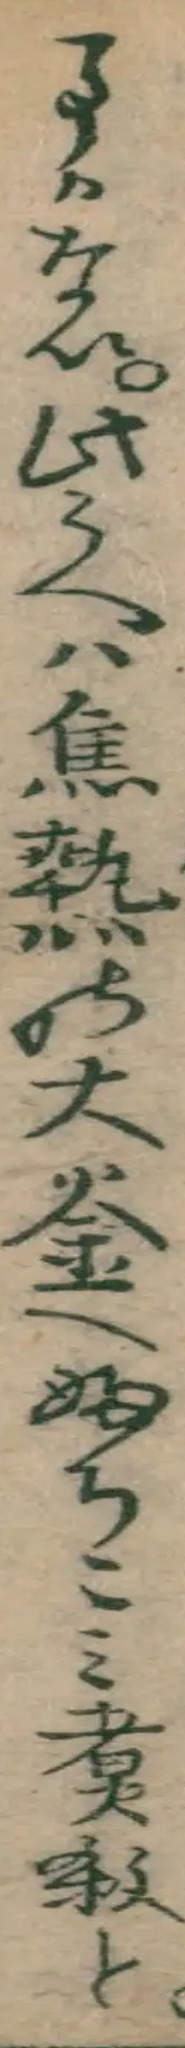事かない。此うへは焦熱の大釜へぶちこみ煮殺と。

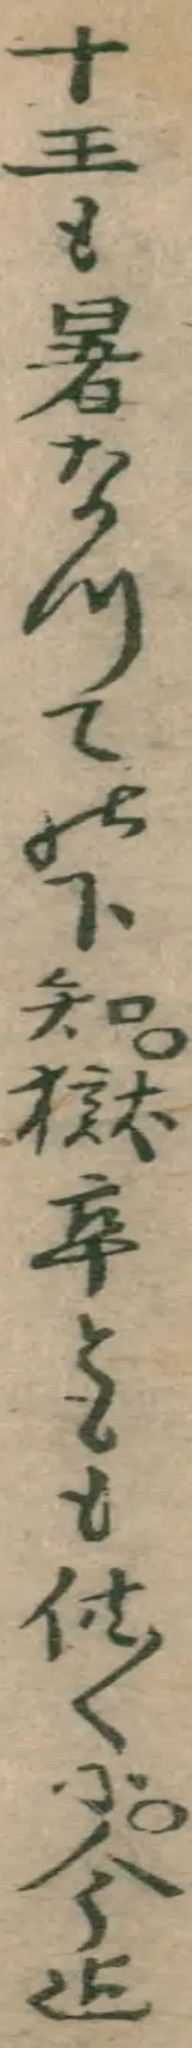十王も暑なつての下知。獄卒ともも供〳〵に。今迄
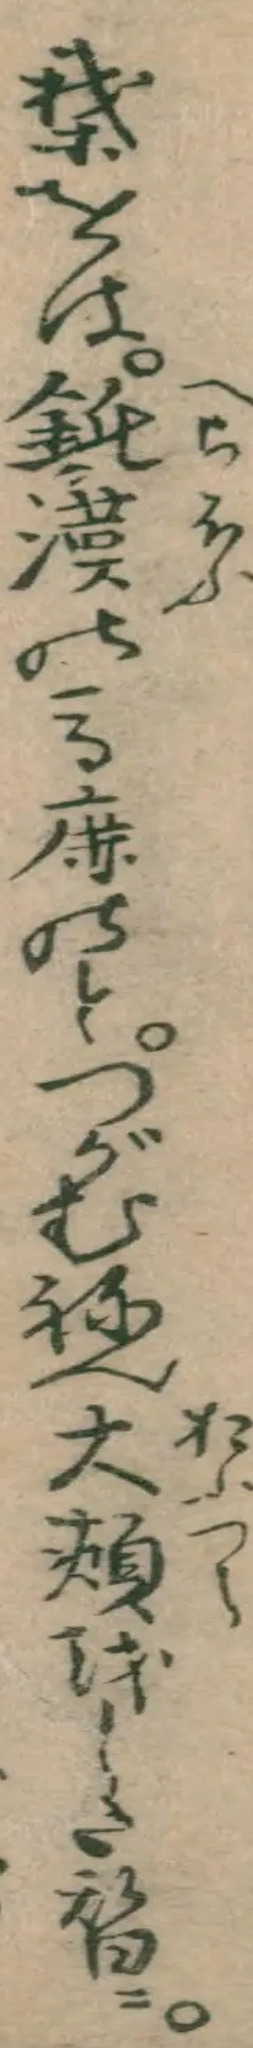我等をは。鈍漢の馬鹿のと。つがむねへ大頬をした替。
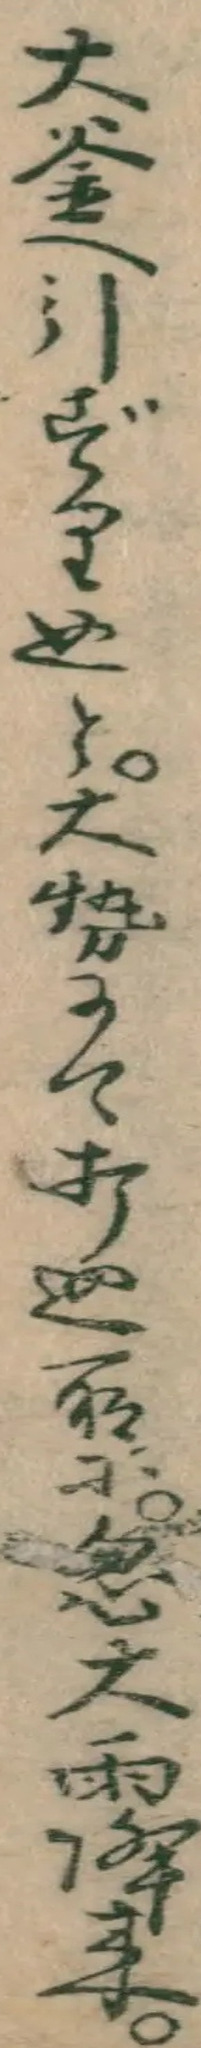大釜へ引ずり込と。大勢にて打込所に。忽大雨降来。
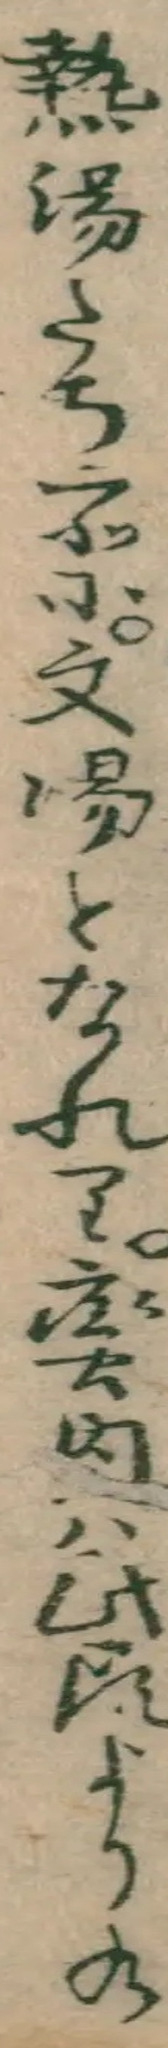熱湯たち所に。文湯となれり。蛮内は此頃よりの
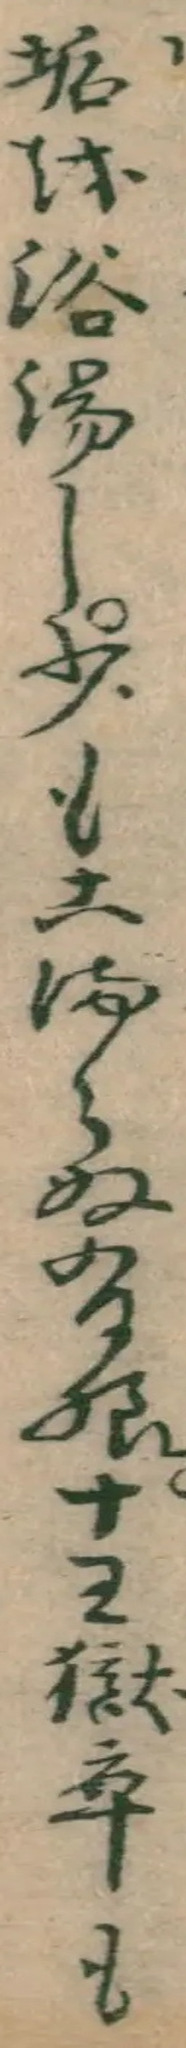垢を浴湯し。少もこまらぬ有様。十王獄卒も
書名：翻草盲目
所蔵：国立国会図書館 National Diet Library, JAPAN
